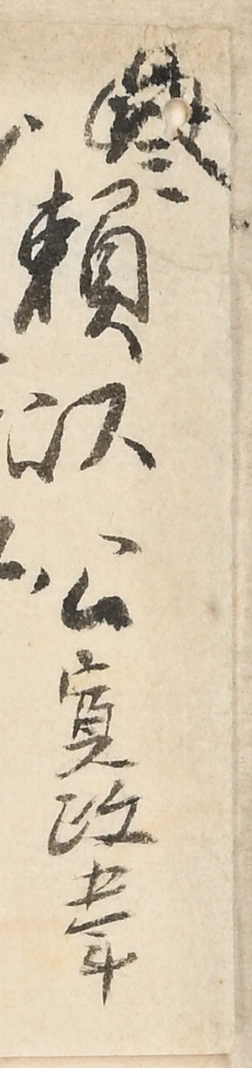頼以公寛政五年

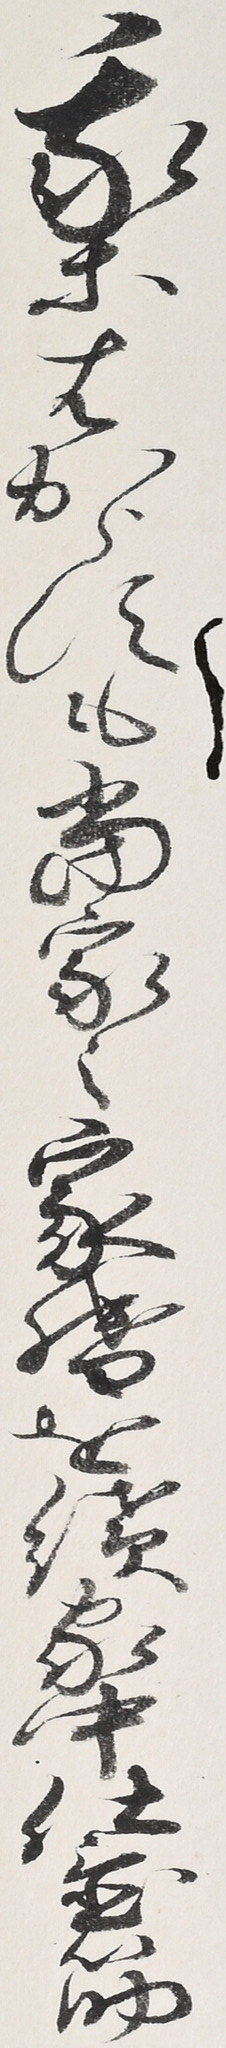我等はからすも当家之家督を続家中仕置筋
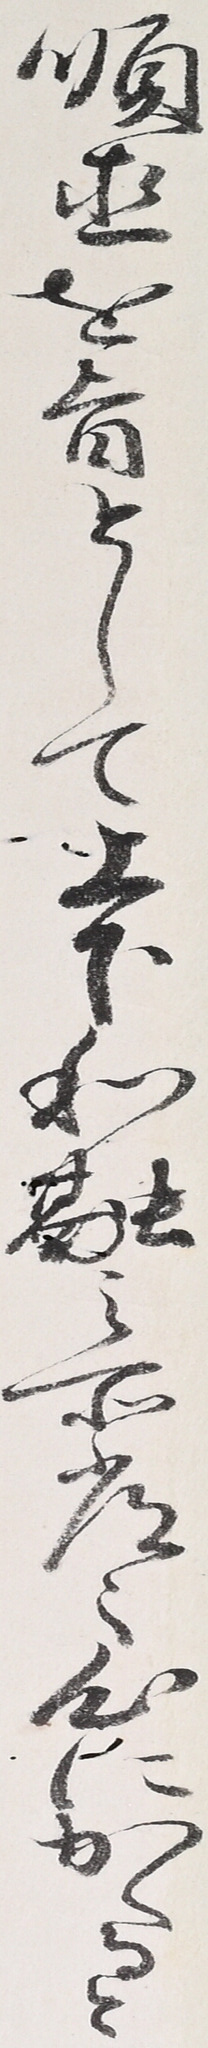順直を旨として上下和融之所常々心にかくると
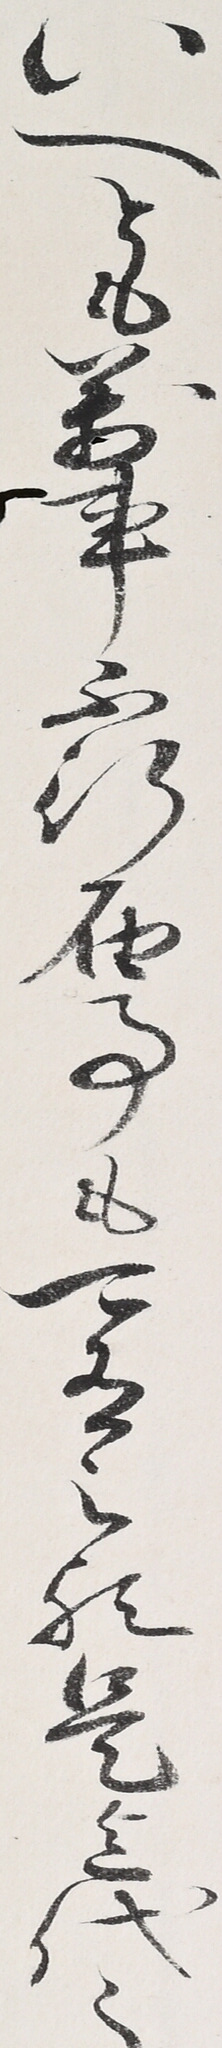いへとも万事不行届も可有之歟是上代々
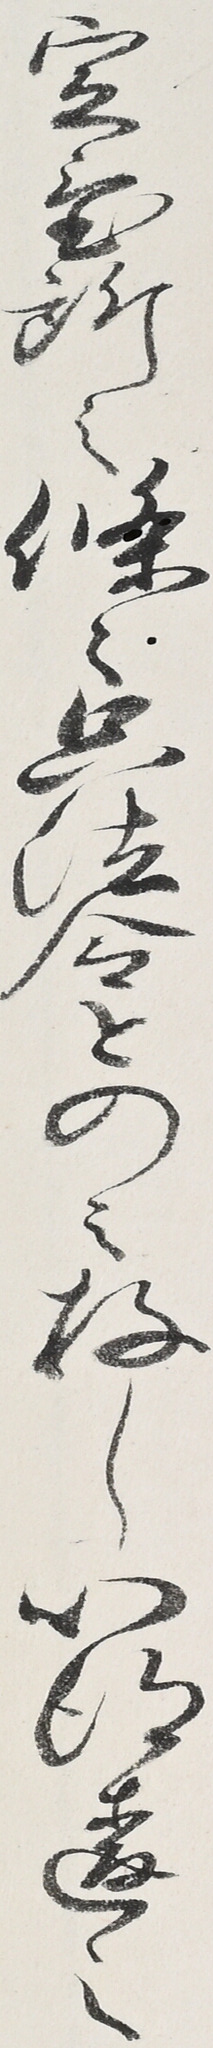定置所之條々只法令とのみ存し心得違之
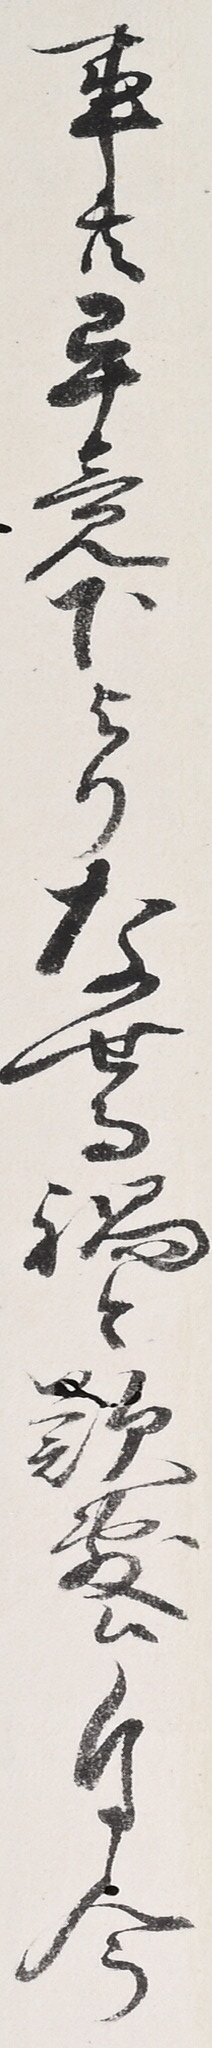事共畢竟下よりなせる禍と歎敷候自今
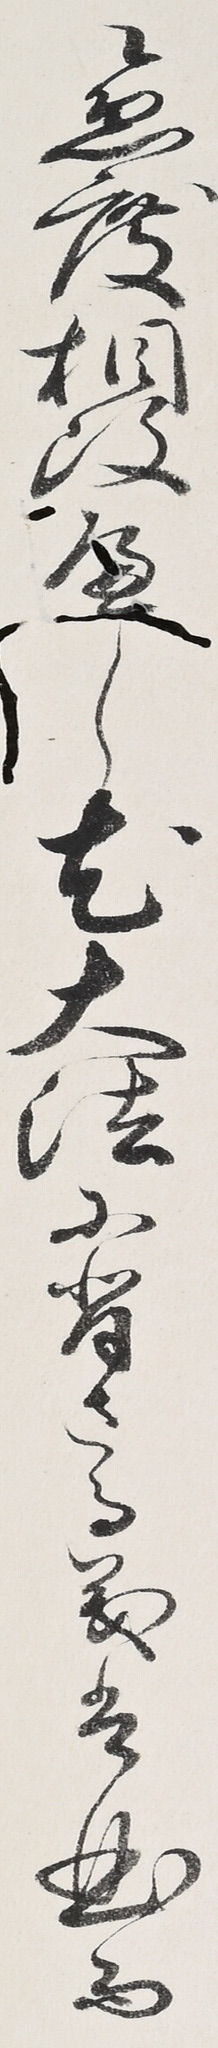急度相改へし尤大法に背さる儀は曲て
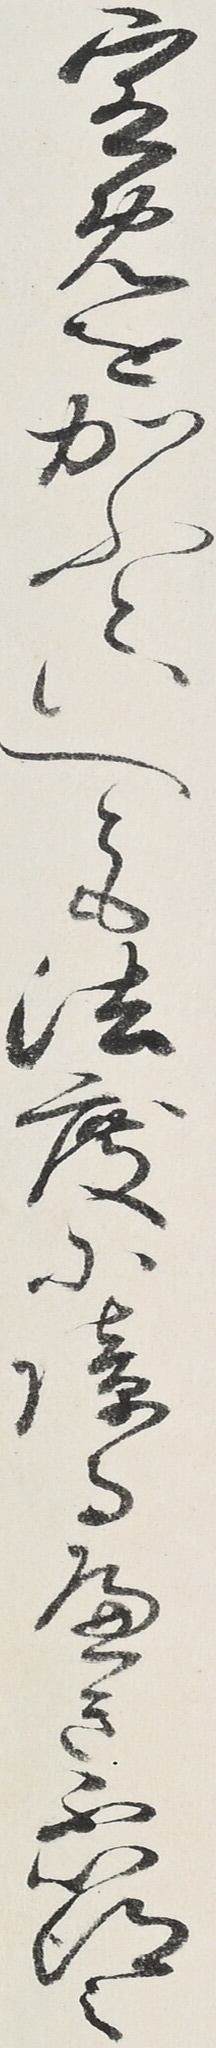定めを加ふといへとも法度に障るへき不心得之
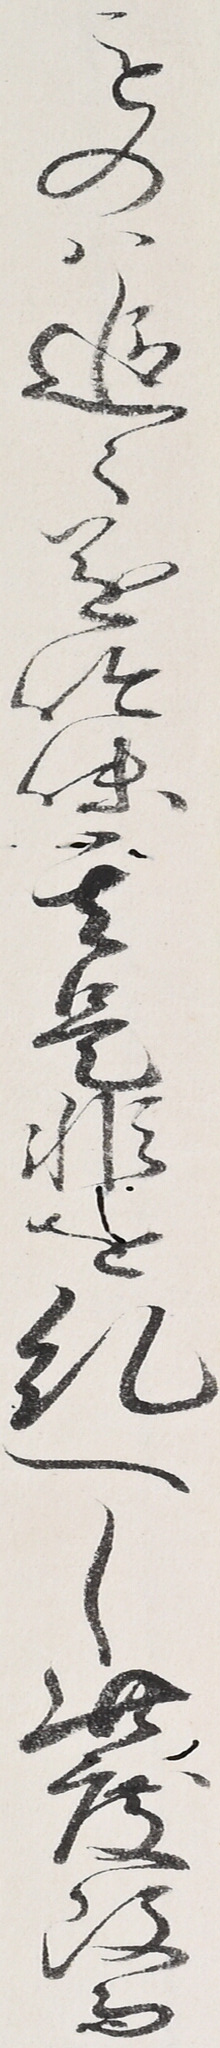ものは追々遂吟味其是非を糺へし此度改て
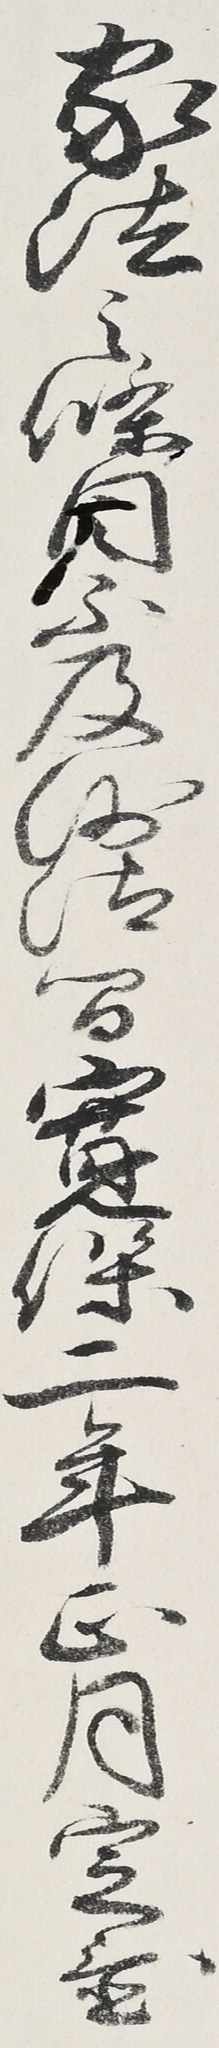家法之條目不及沙汰間寛保二年正月定置
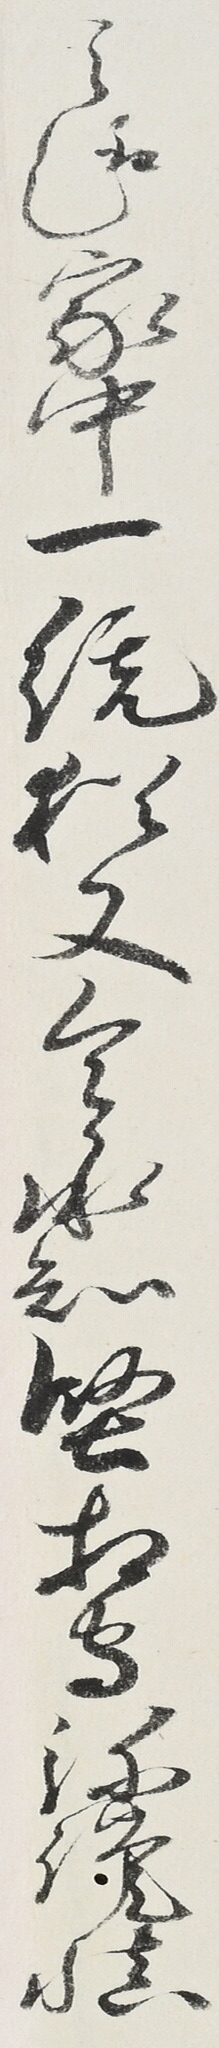之趣家中一統猶又令承知堅相守弥謹慎
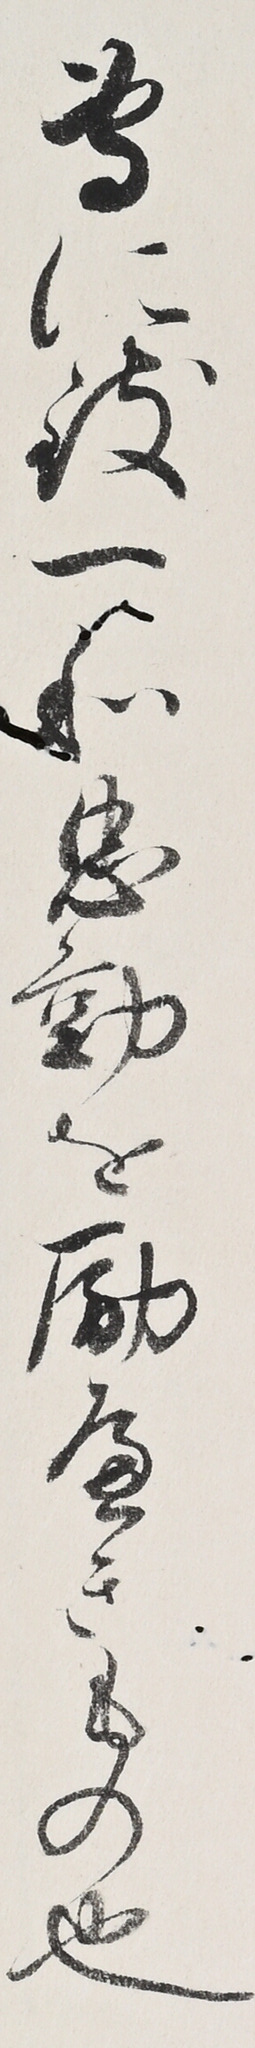専に致一和忠勤を励へきもの也
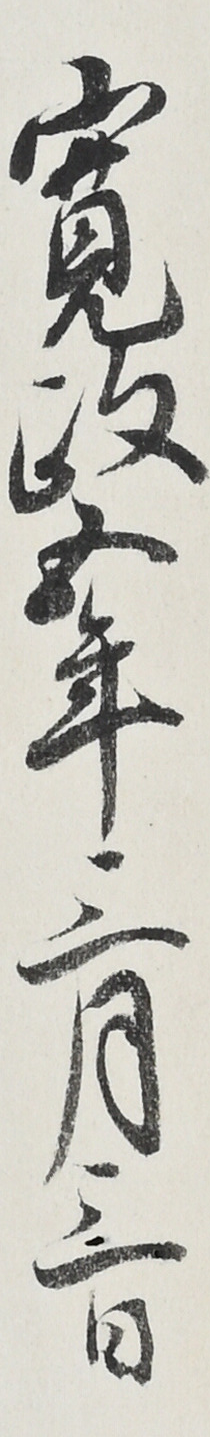寛政五年三月三日

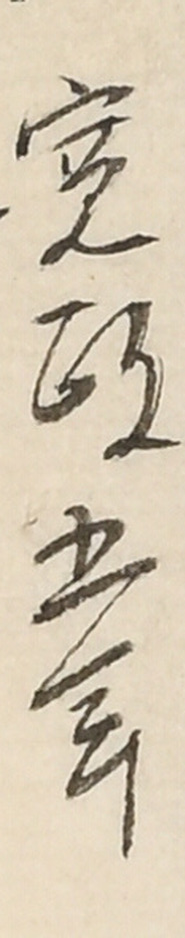寛政五年
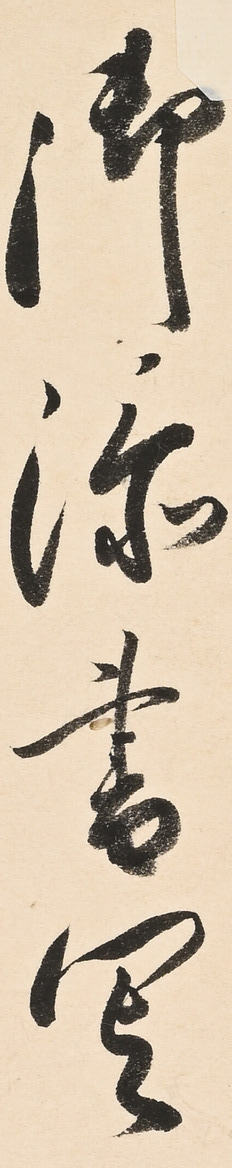御添書写

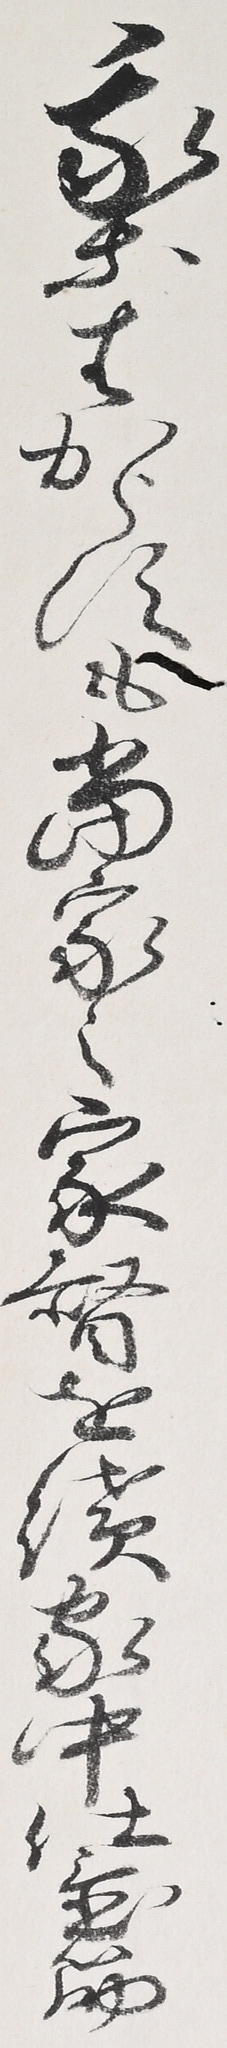我等はからすも当家之家督を続家中仕置筋
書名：御添書〔写共二通一括〕
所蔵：伊那市立高遠町図書館・合同会社AMANE
